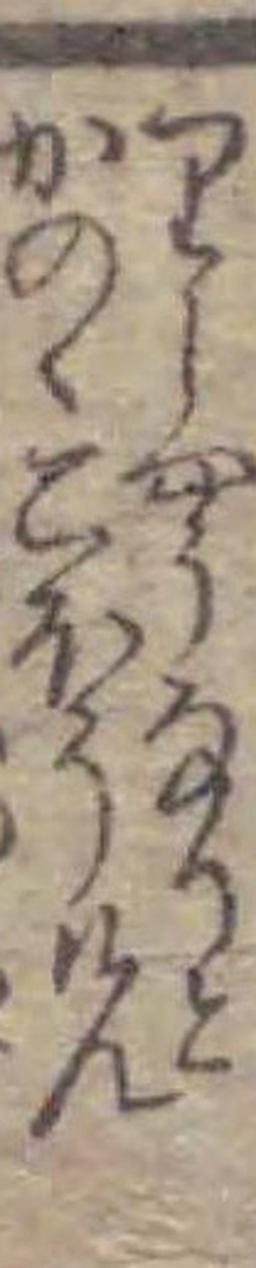かのゝこほうけん
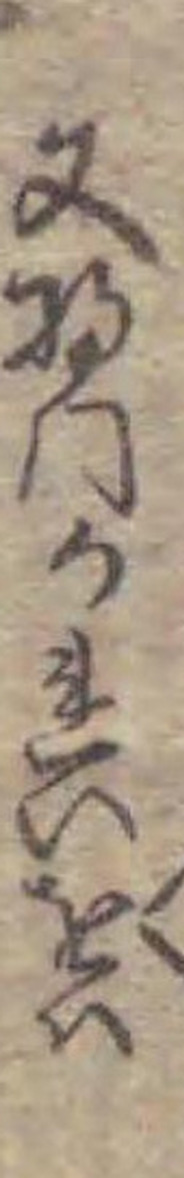又将門かれいをは
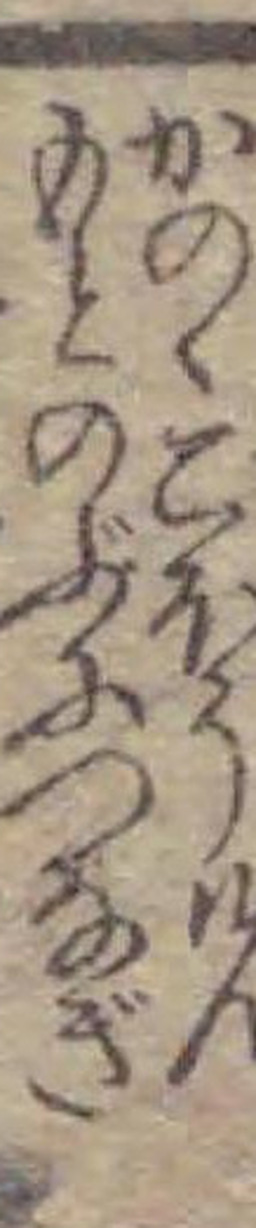もとのぶにつなぎ
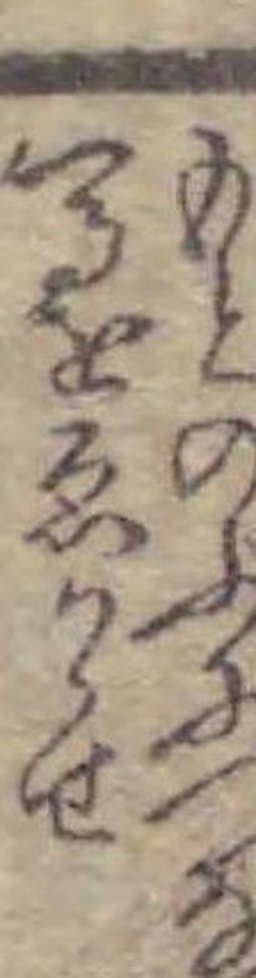馬をゑかゝせ
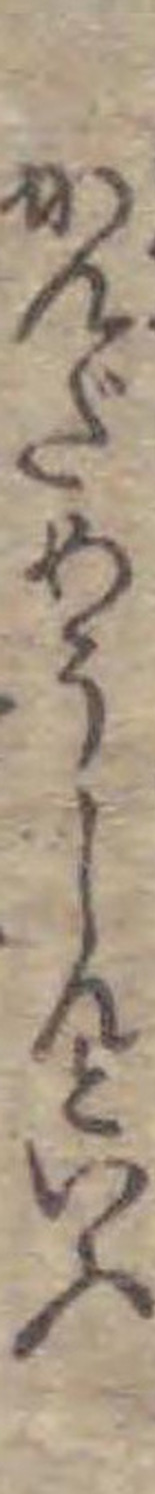かんだめうしんといふ
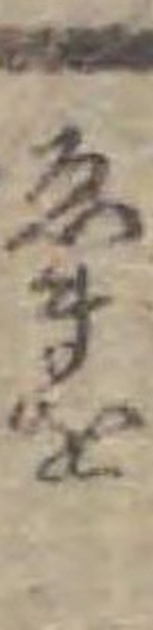ゑまを
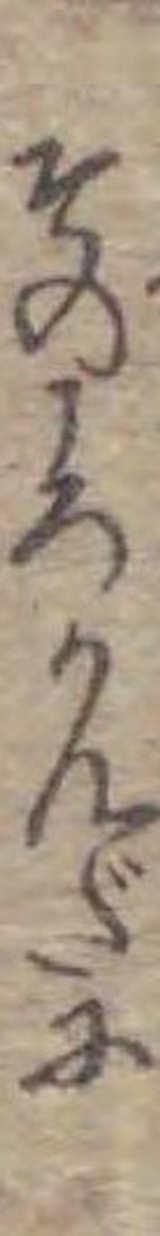そのころかんだに
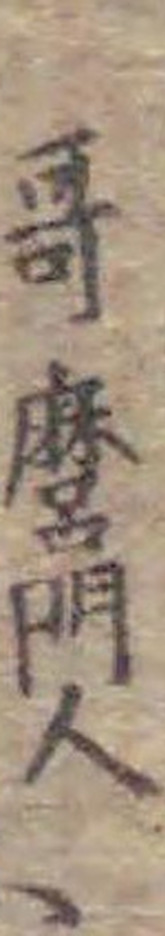歌麿門人
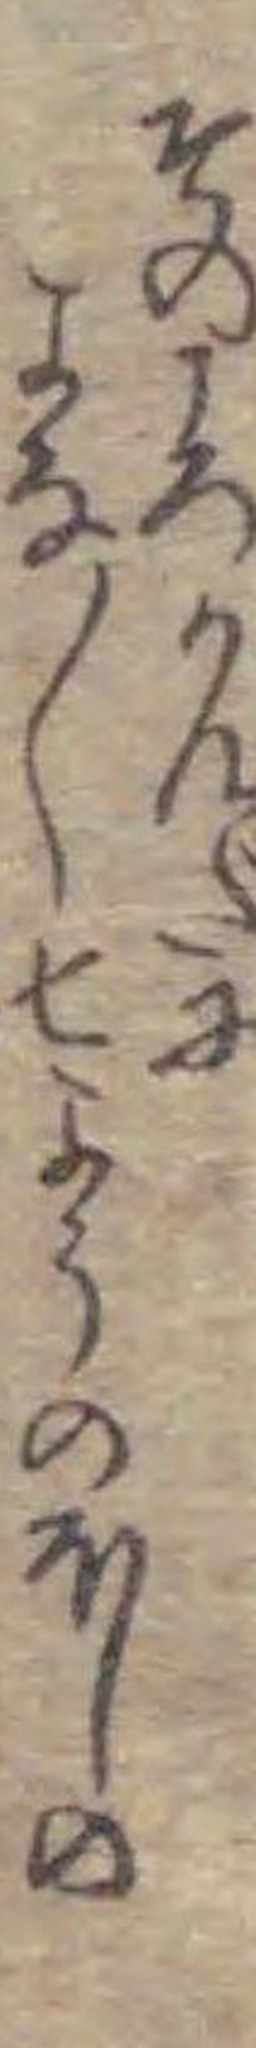よな〳〵七ようのほしの
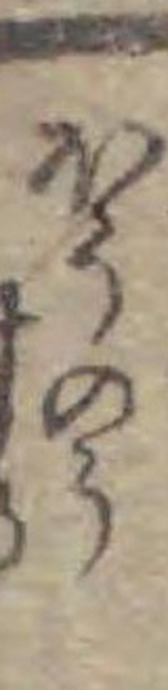ほうのう
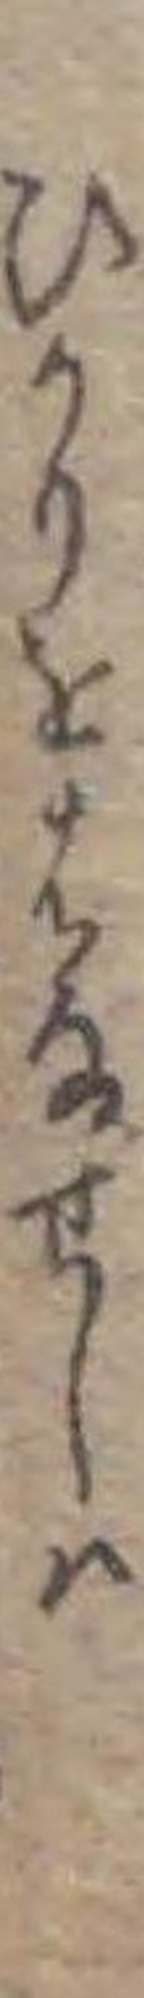ひかりをはなせしは
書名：時代世話二挺皷 : 2巻
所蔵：国立国会図書館 National Diet Library, JAPAN
